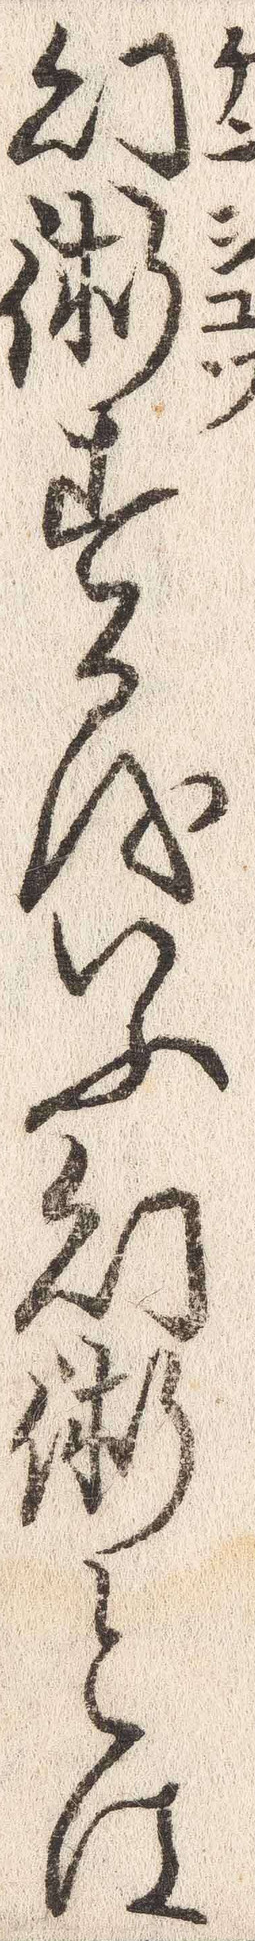幻術するをいふ幻術とは
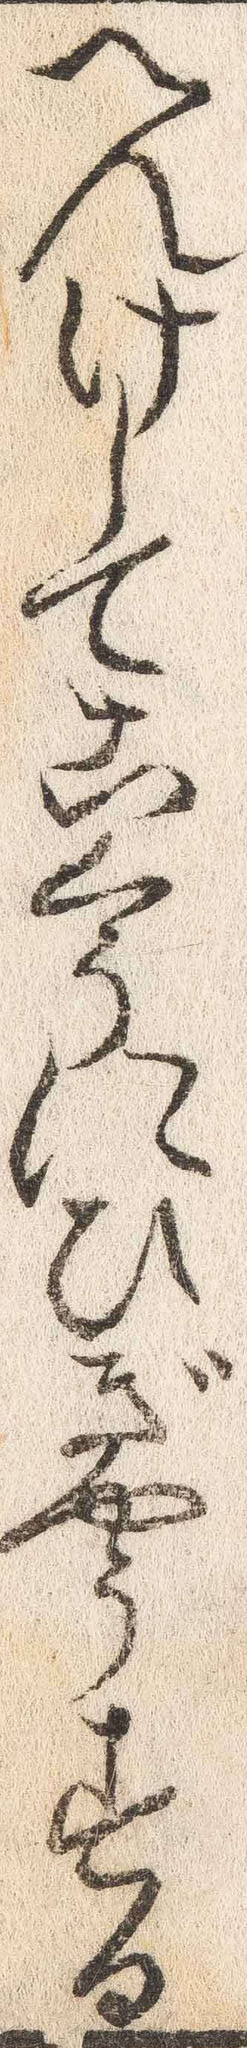へんけしてこくうにひぎやうする

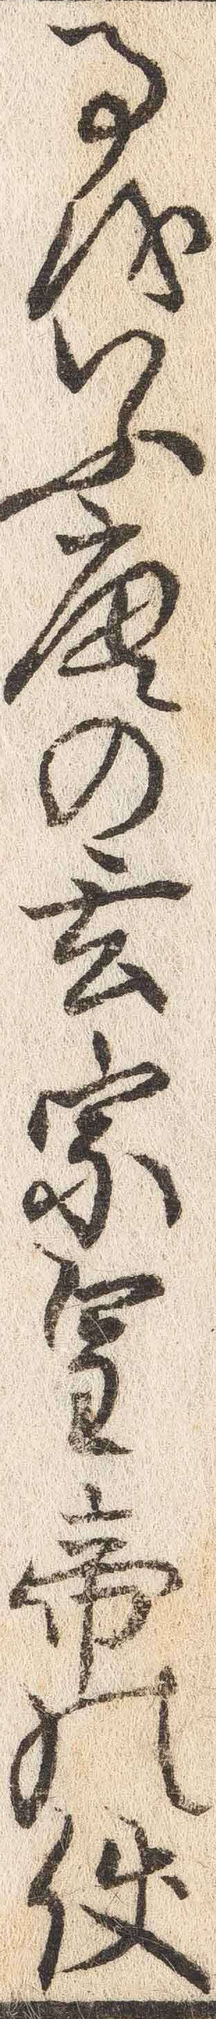事をいふ唐の玄宗皇帝の使
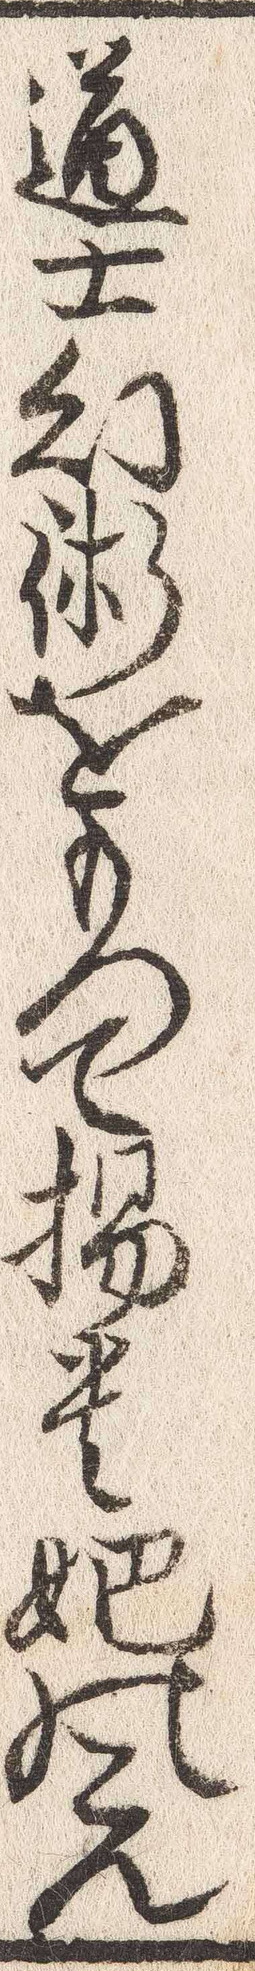道士幻術をもつて楊貴妃のこん
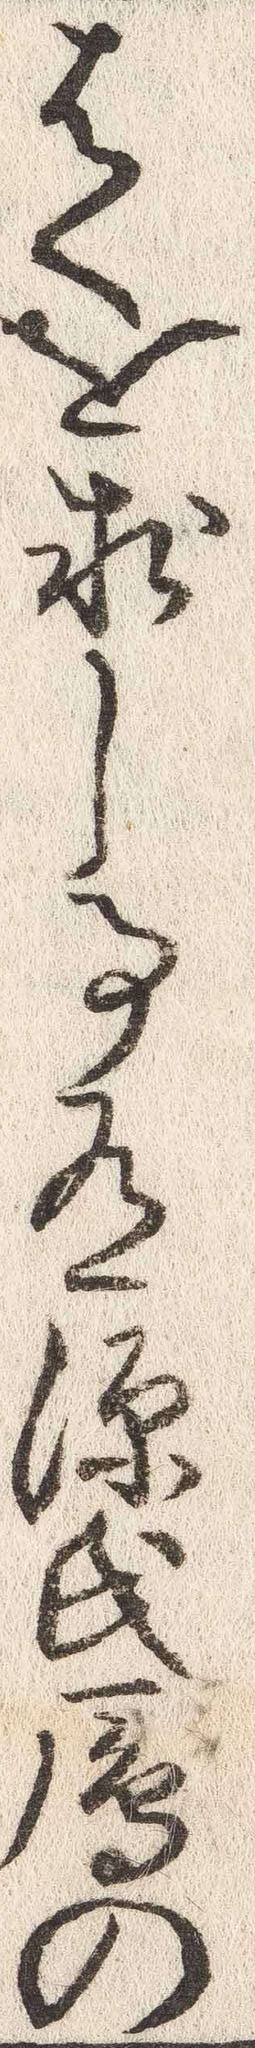はくを求し事有源氏鳫の
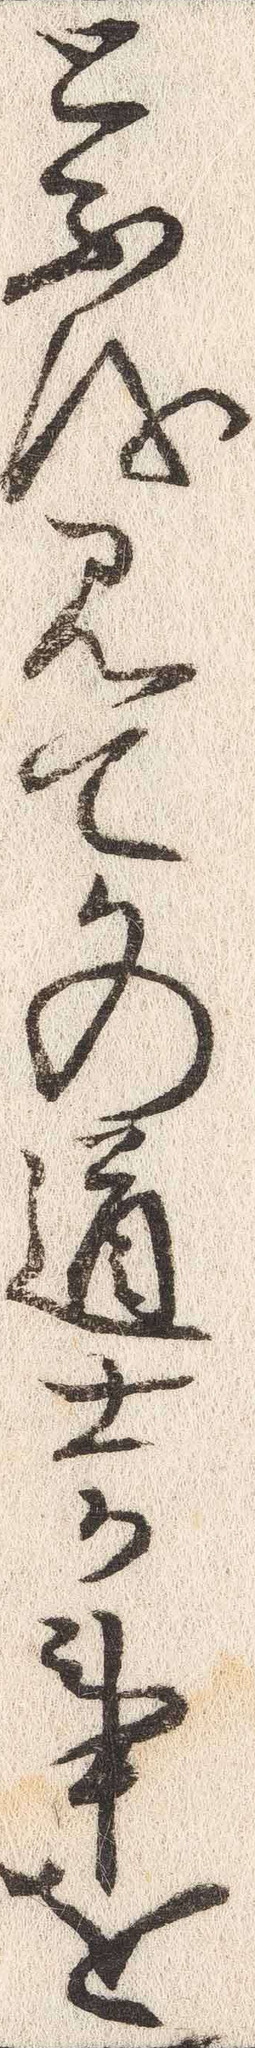とふをみてかの道士か事を
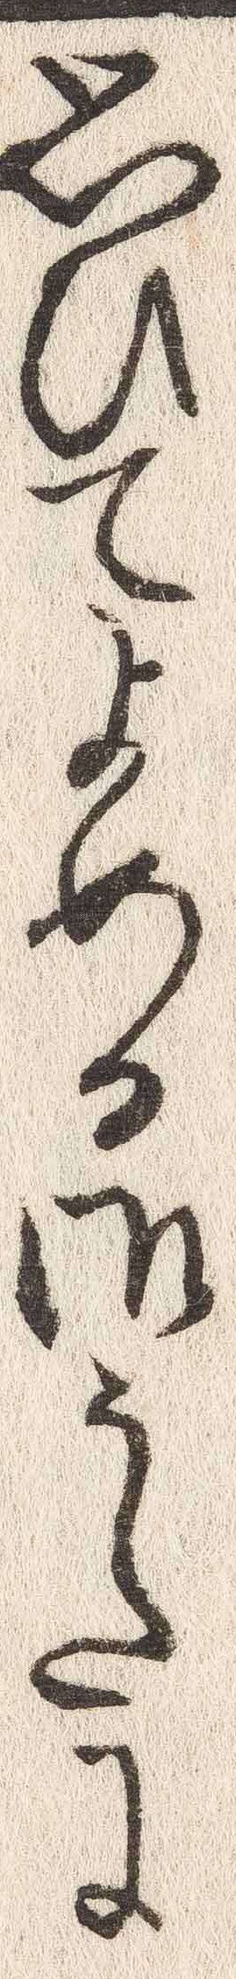思ひてよめる御うたに
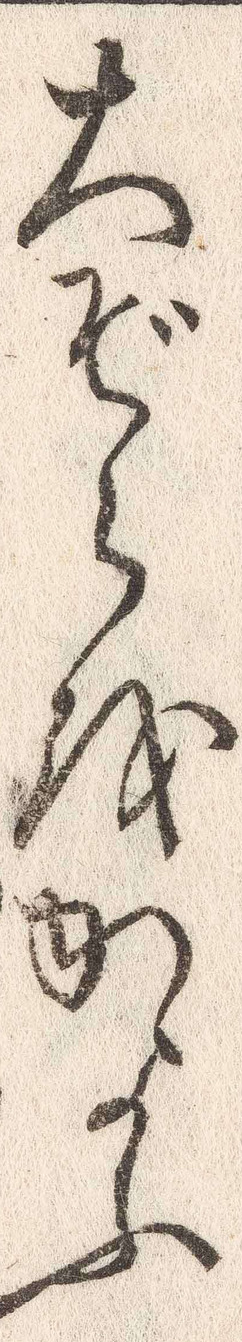大ぞらをかよふ
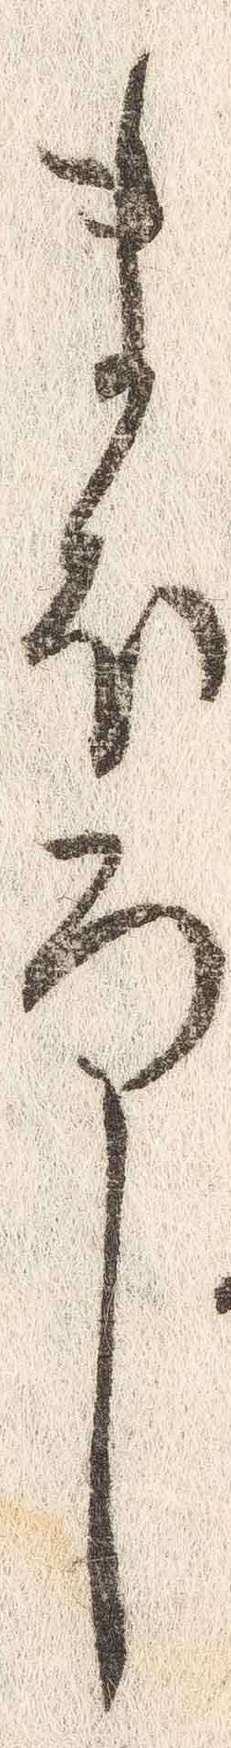まほろし
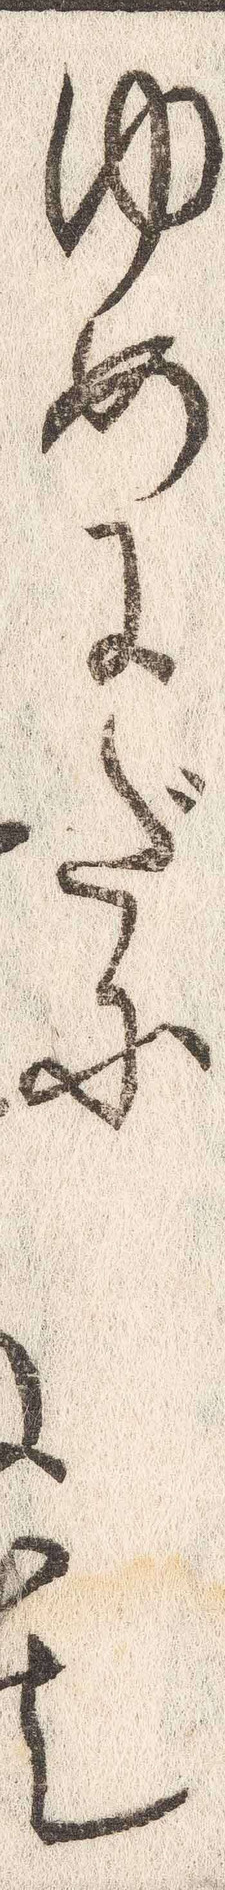ゆめにだに
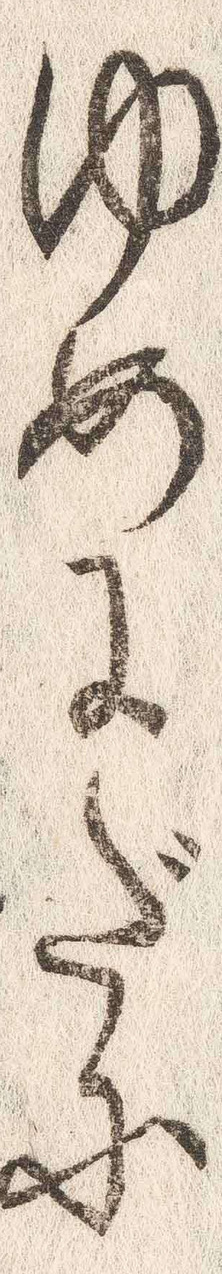ゆめにだに
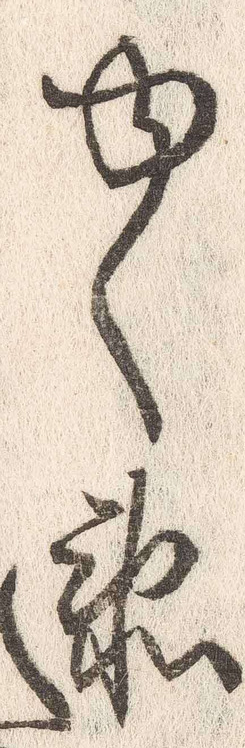ゆくゑ
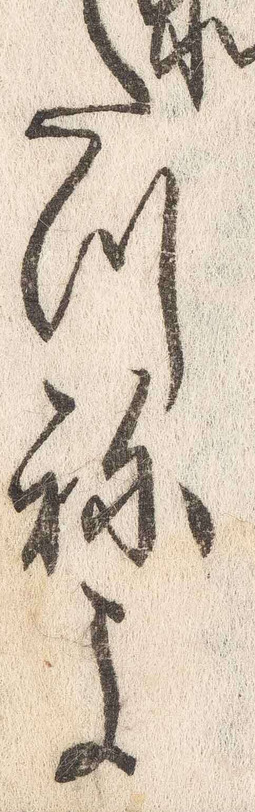たつねよ

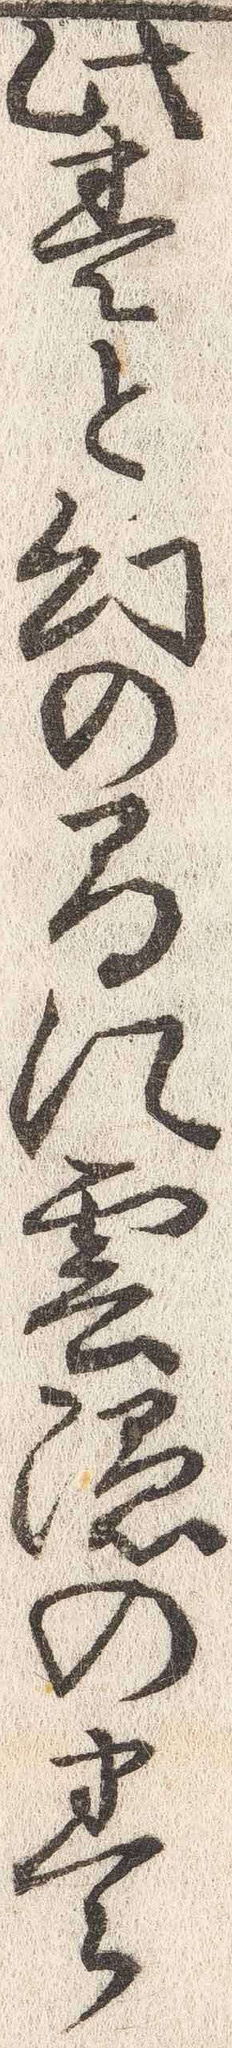此巻と幻の間に雲隠の巻
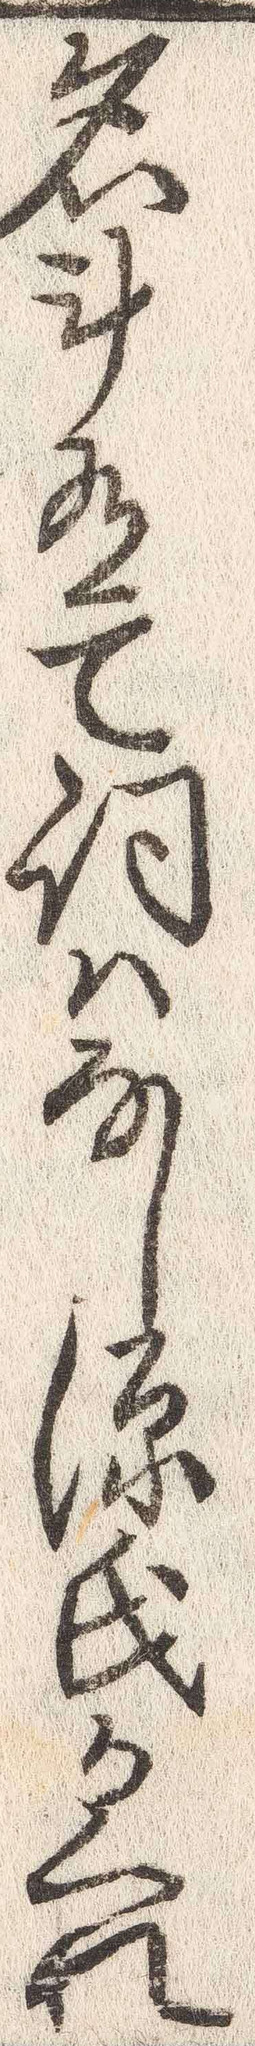名計有て詞はなし源氏かくれ
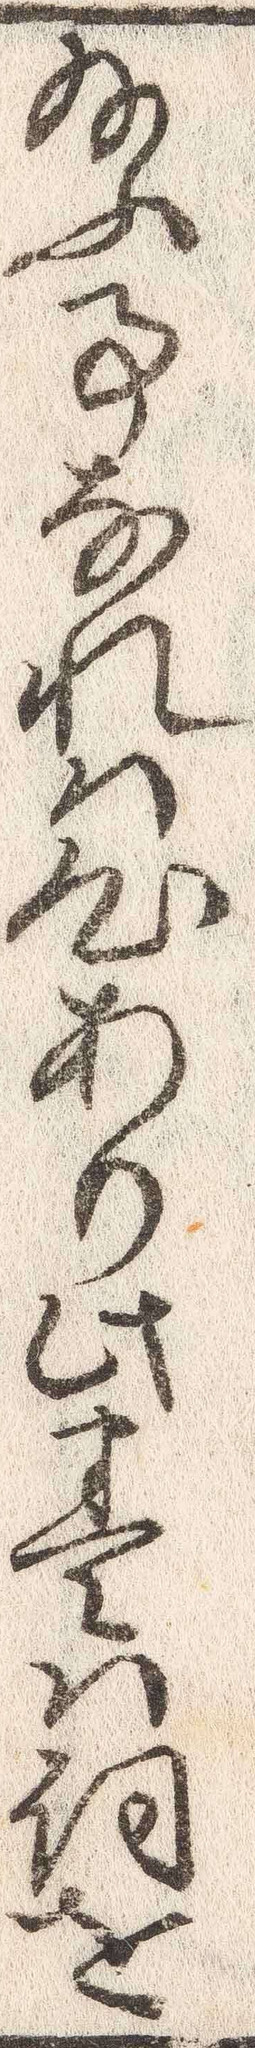給ふ事なれは心あり此巻は詞を
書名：源氏物語
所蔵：東京学芸大学附属図書館 国文学研究資料館
